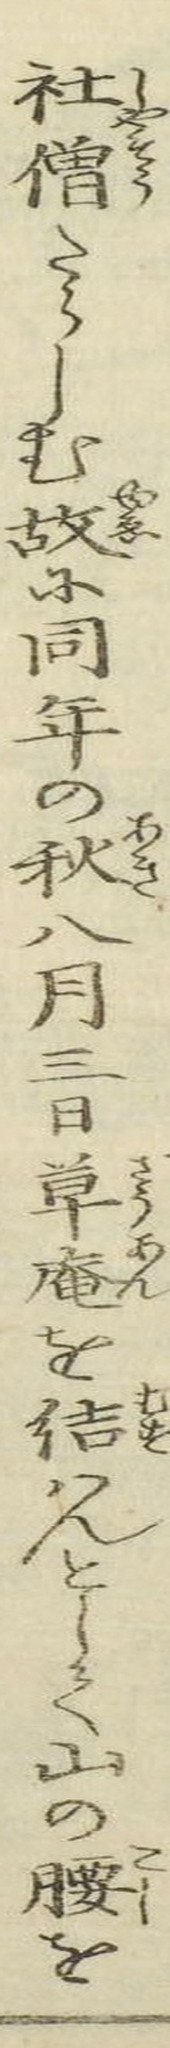社僧たらしむ故に同年の秋八月三日草庵を結はんとして山の腰を
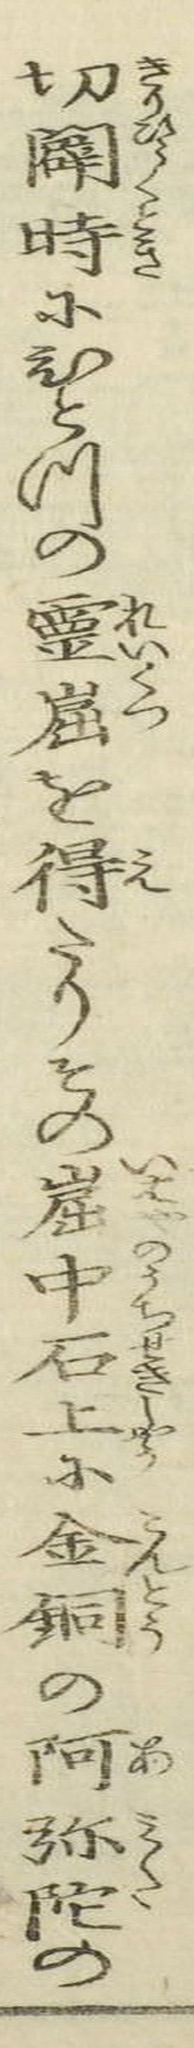切闢時にひとつの霊崫を得たりその崫中石上に金銅の阿弥陀の
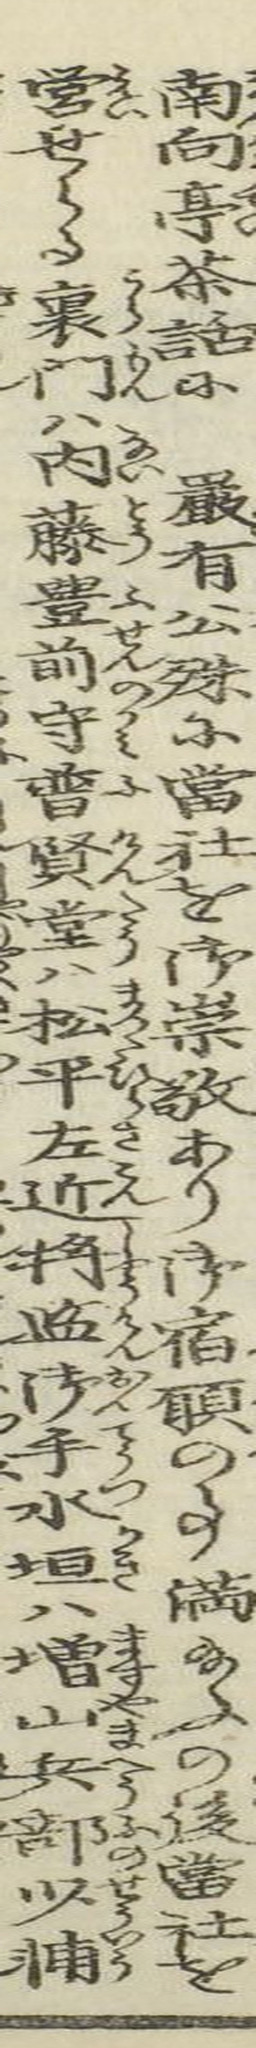営せらる裏門は内藤豊前守普賢堂は松平左近将監御手水垣は増山兵部少輔

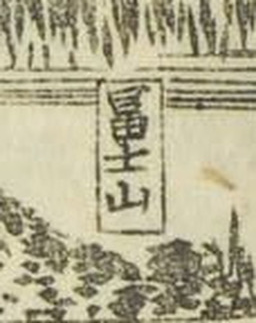富士山
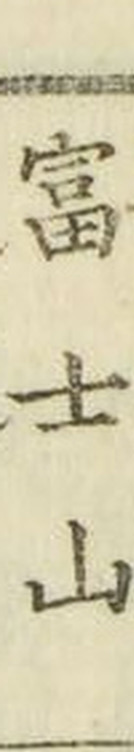富士山
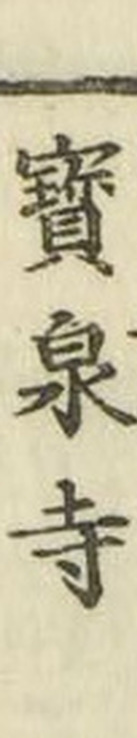宝仙寺

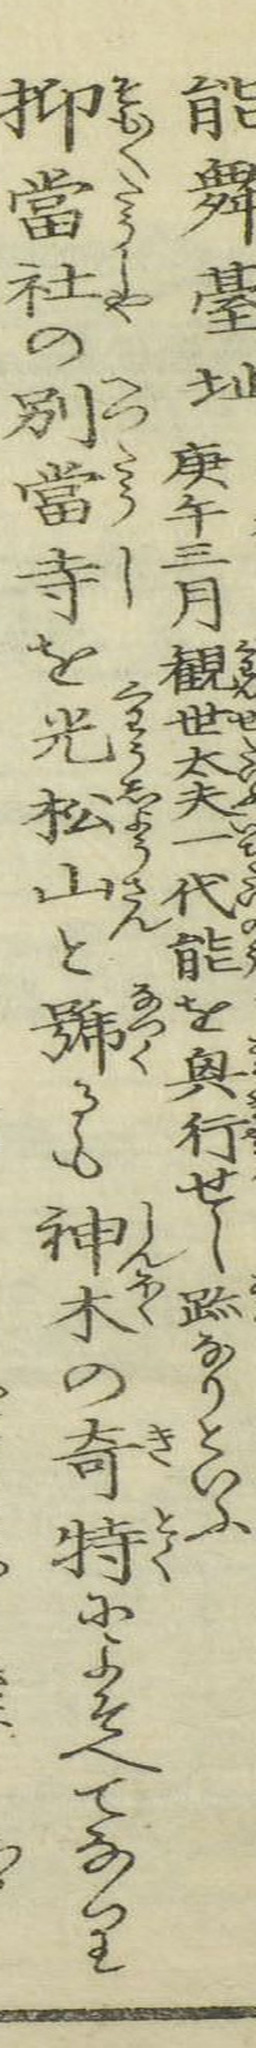抑当社の別当寺を光松山と号るも神木の奇特によそへてなり
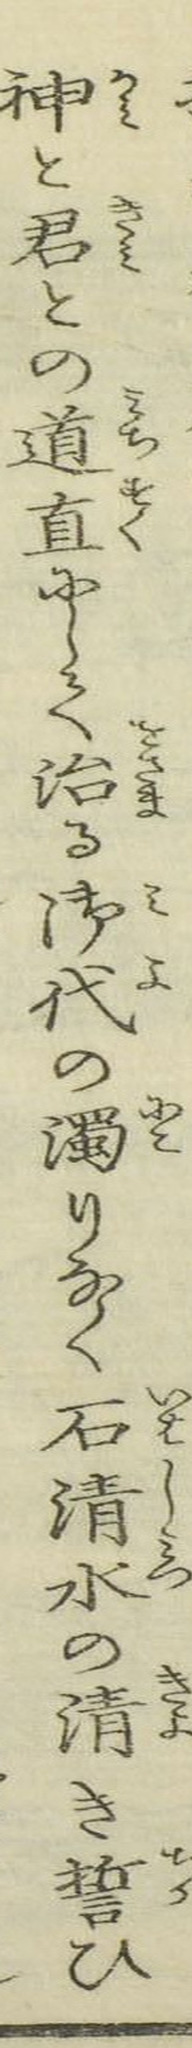神と君との道直にして治る御代の濁りなく石清水の清き誓ひ
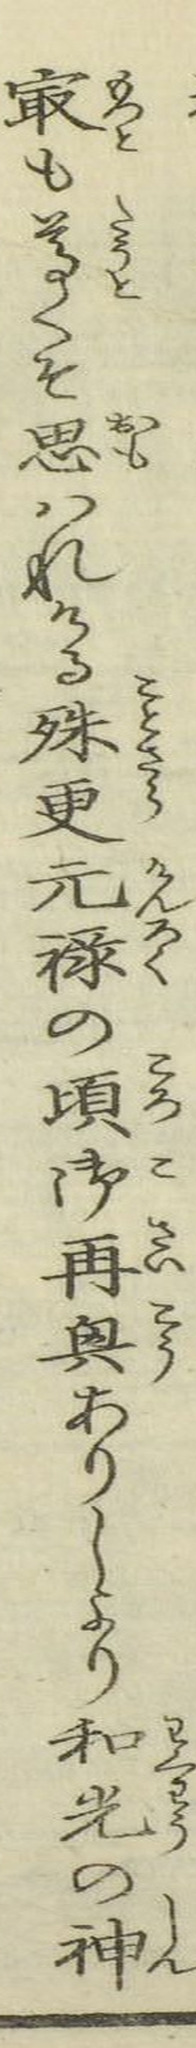最も尊くそ思はれける殊更元禄の頃御再興ありしより和光の神
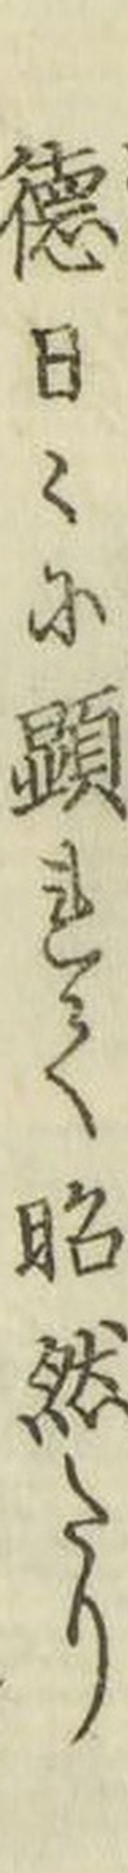徳日々に顕れて昭然たり
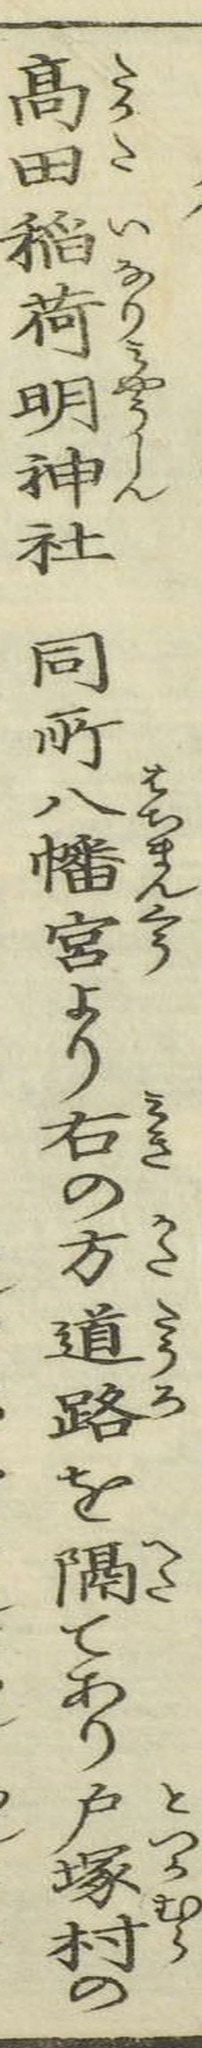髙田稲荷明神社同所八幡宮より右の方道路を隔てあり戸塚村の
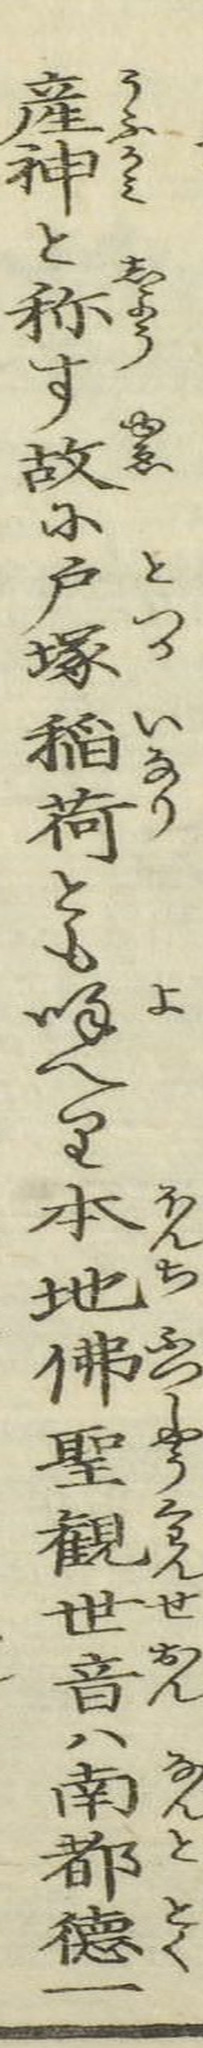産神と称す故に戸塚稲荷とも呼へり本地仏聖観世音は南都徳一
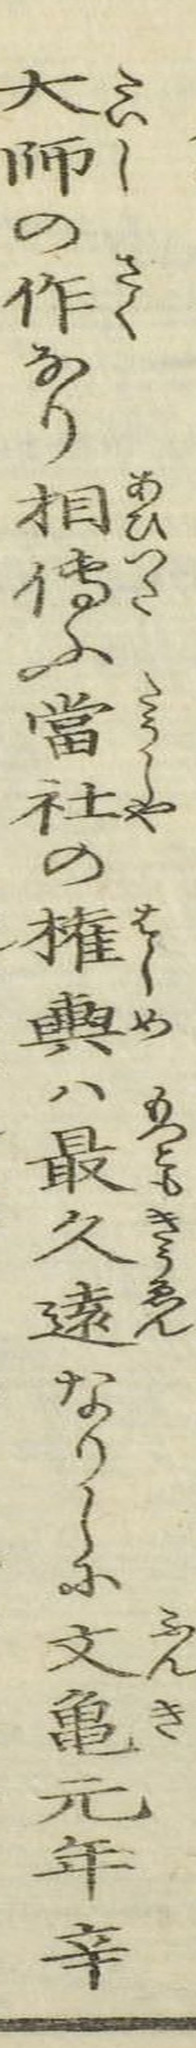大師の作なり相伝ふ当社の権輿は最久遠なりしに文亀元年辛
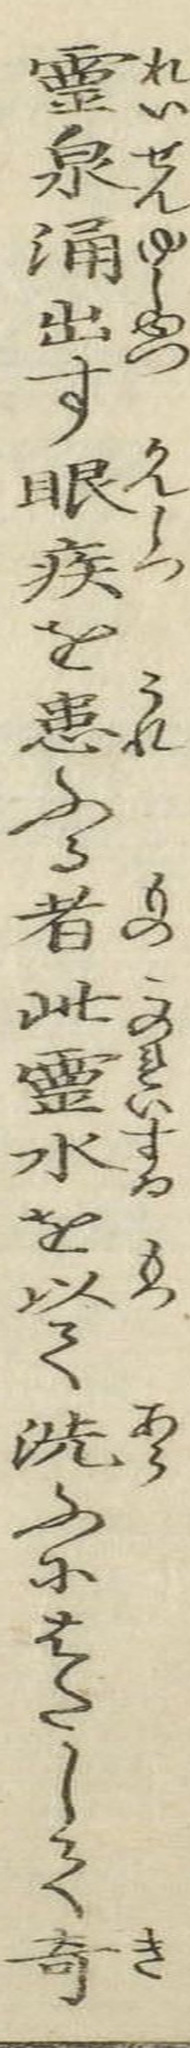霊泉涌出す眼疾を患ふる者此霊水を以て洗ふにはたして奇
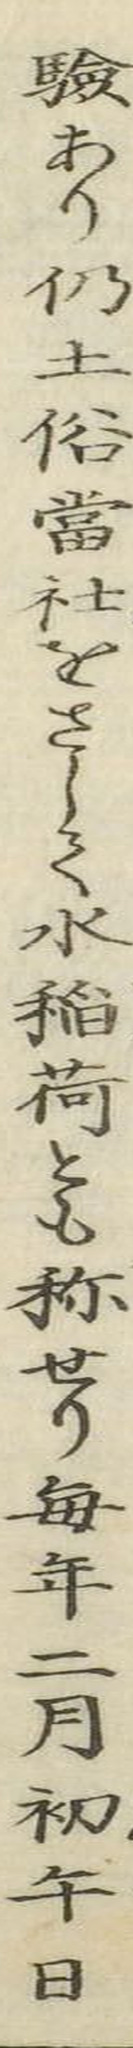験あり仍土俗当社をさして水稲荷とも称せり毎年二月初午日
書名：江戸名所図会 20巻 巻之11
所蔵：東京学芸大学教育コンテンツアーカイブ
